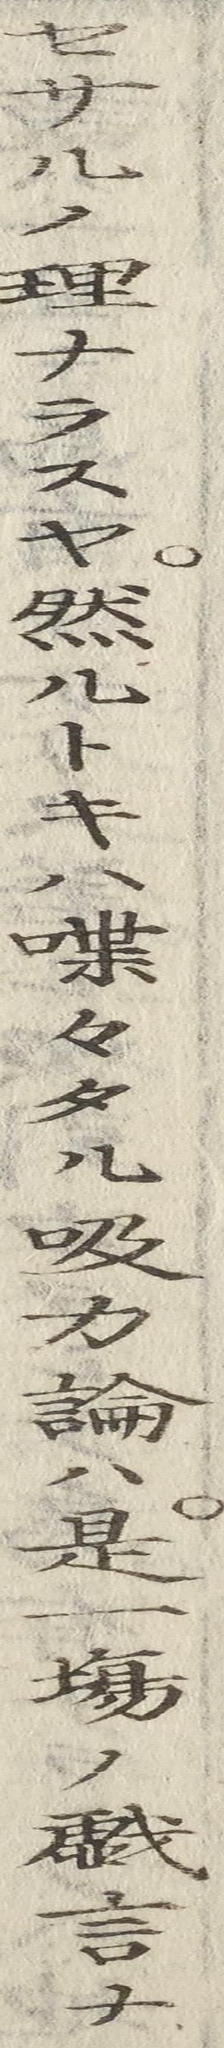セサルノ理ナラスヤ。然ルトキハ喋々タル吸カ論ハ。是一場ノ戯言ナ
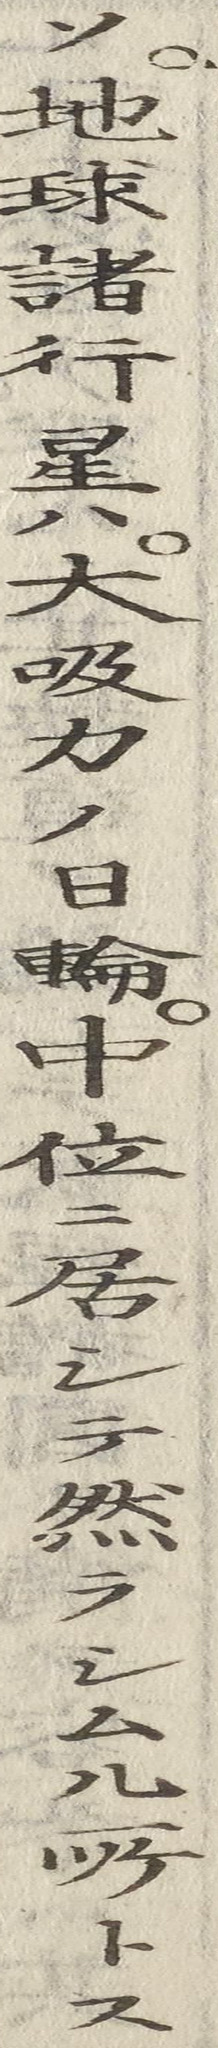ソ。地球諸行星ハ。大吸カノ日輪。中位ニ居シテ然ラシムル所トス
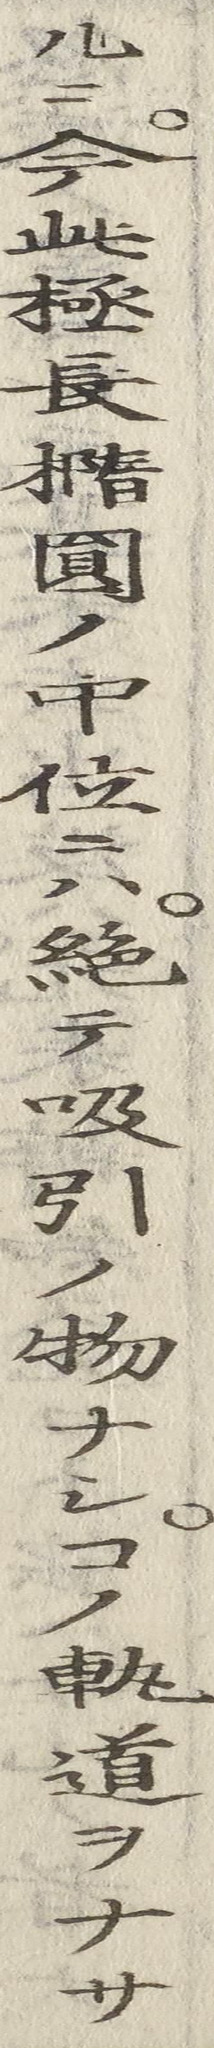ルニ。今此極長橢円ノ中位ニハ。絶テ吸引ノ物ナシ。コノ軌道ヲナサ
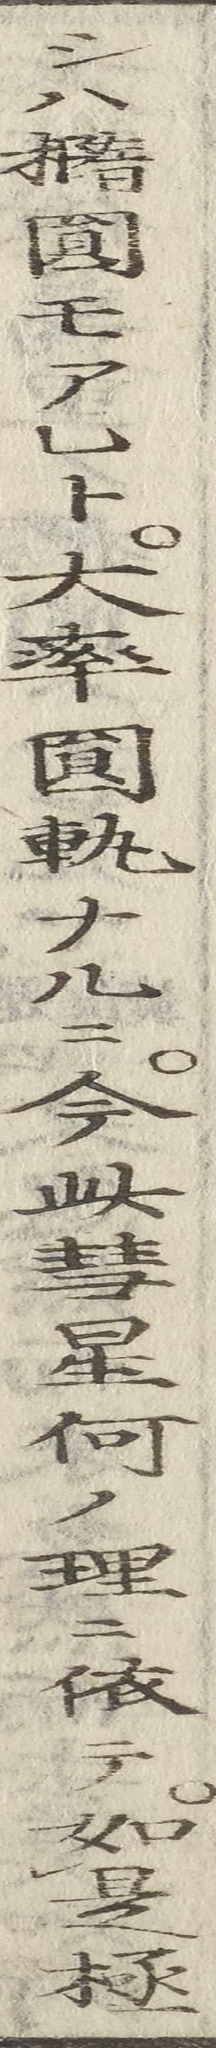シハ橢円モアレト。大率円軌ナルニ。今此彗星何ノ理ニ依テ。如是極

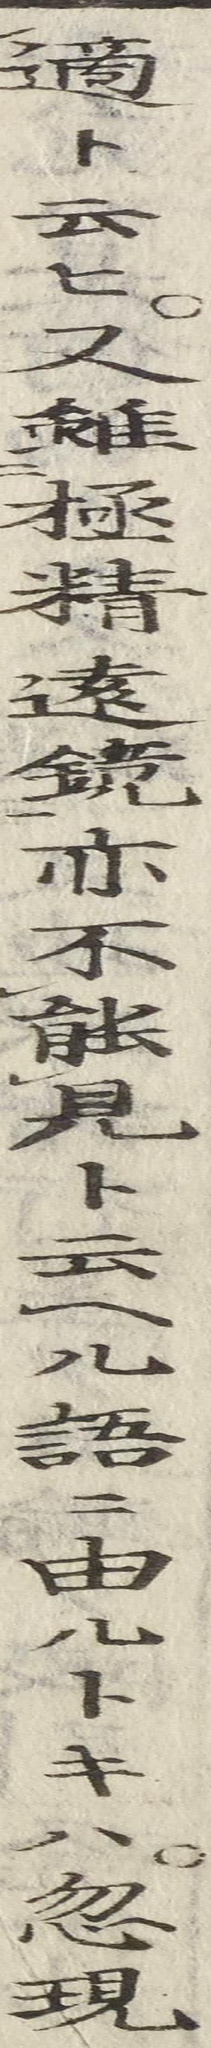適ト云ヒ。又雖極精遠鏡亦不能見ト云ヘル語ニ由ルトキハ。忽現
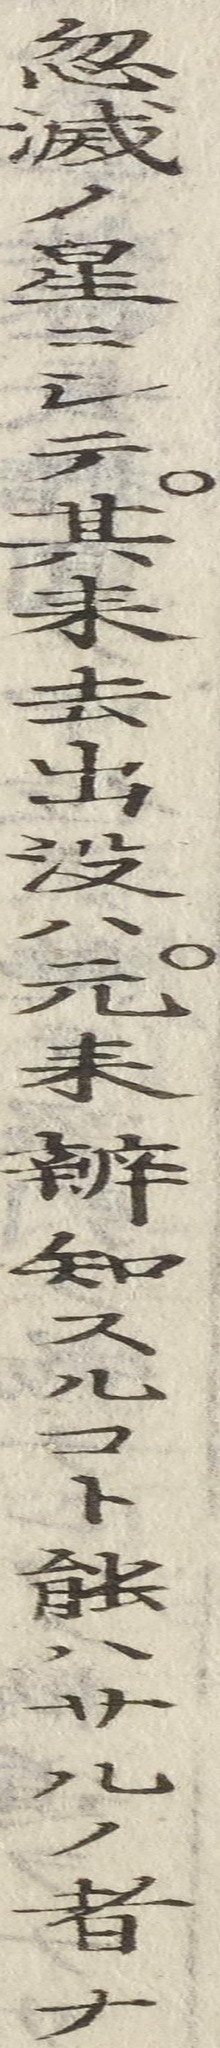忽滅ノ星ニシテ。其来去出没ハ。元来弁知スルコト能ハサルノ者ナ
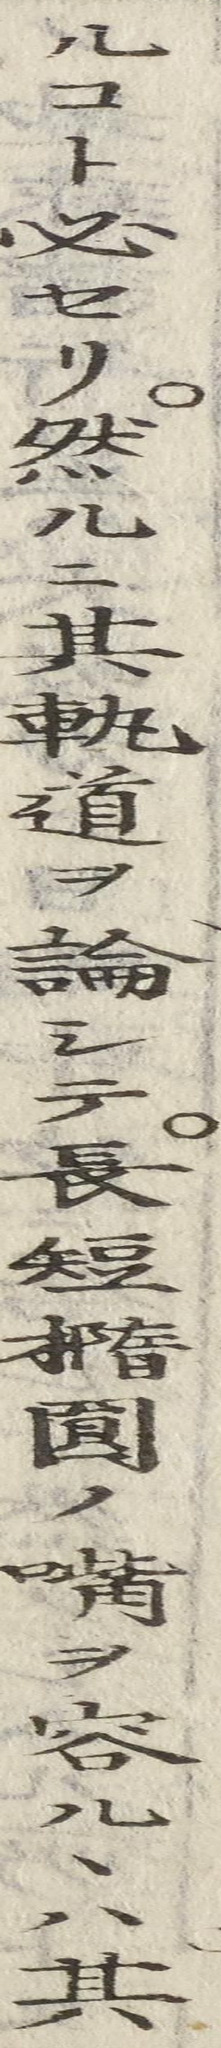ルコト必セリ。然ルニ其軌道ヲ論シテ。長短橢円ノ嘴ヲ容ルヽハ。其
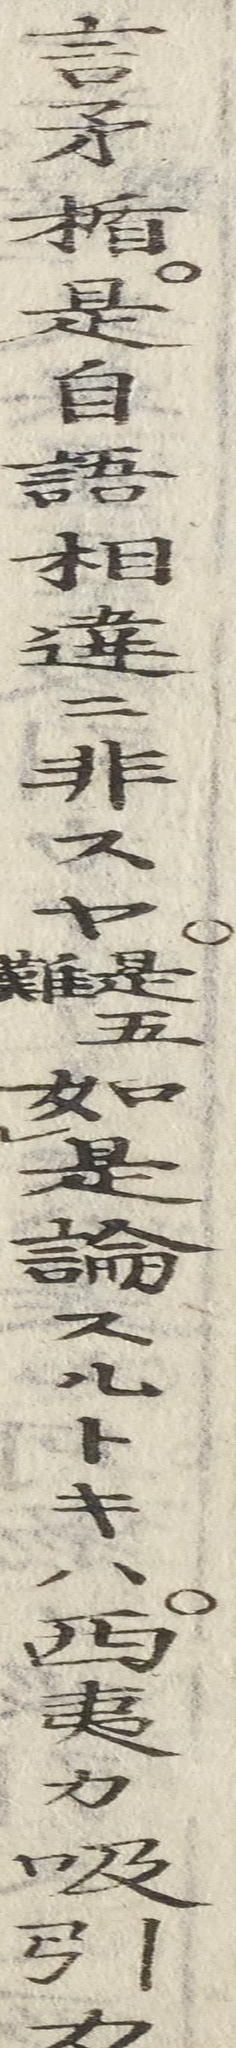言矛盾。是自語相違ニ非スヤ。是五難如是論スルトキハ。西夷カ吸引カ
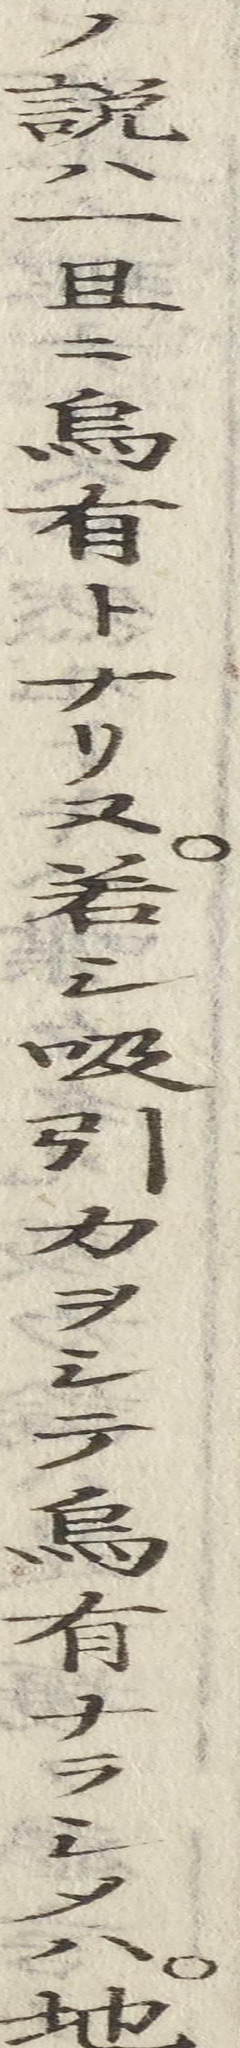ノ説ハ一且ニ烏有トナリヌ。若シ吸引カヲシテ烏有ナラシメハ。地
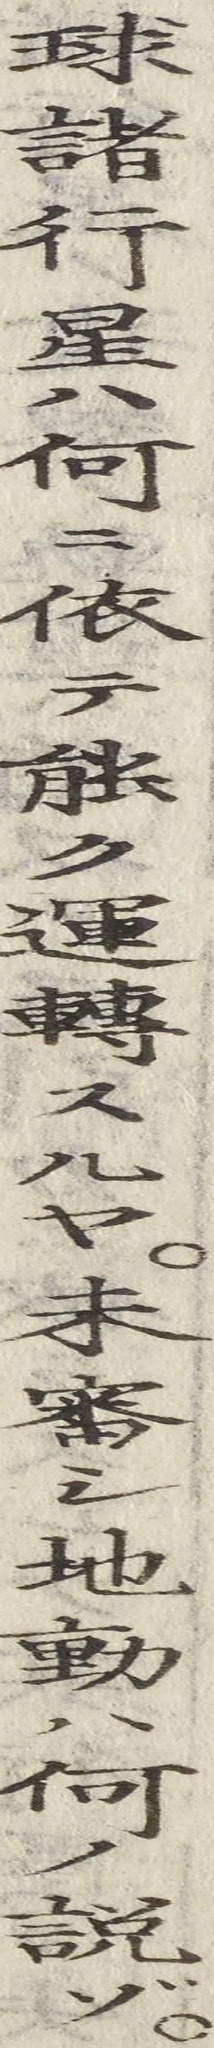球諸行星ハ何ニ依テ能ク運転スルヤ。未審シ地動ハ何ノ説ゾ。
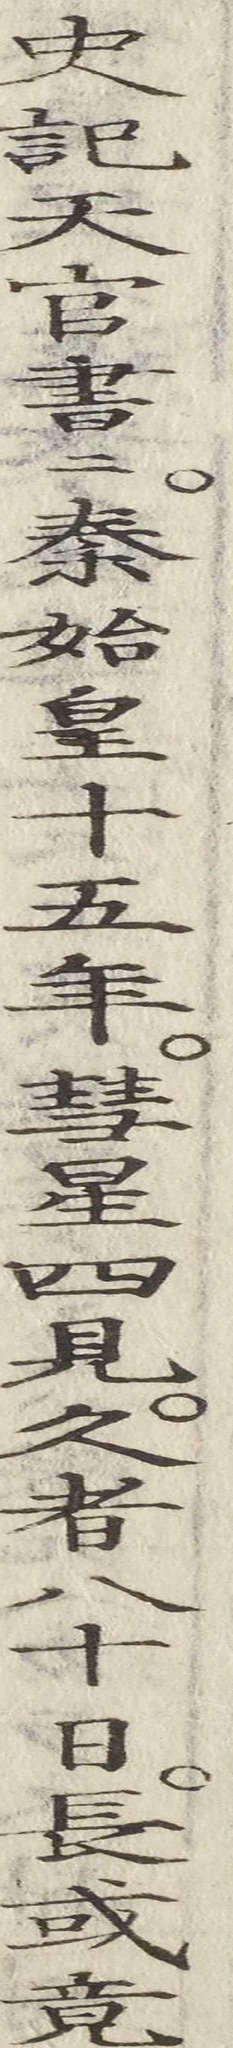史記天官書ニ。秦始皇十五年。彗星四見。久者八十日。長或竟
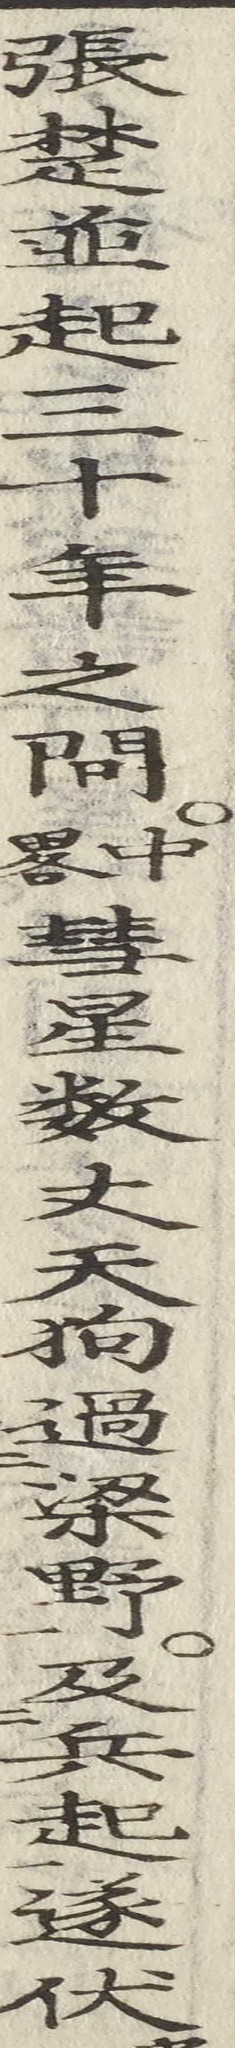張楚並起三十年之間。中略彗星数丈天狗過梁野。及兵起遂伏
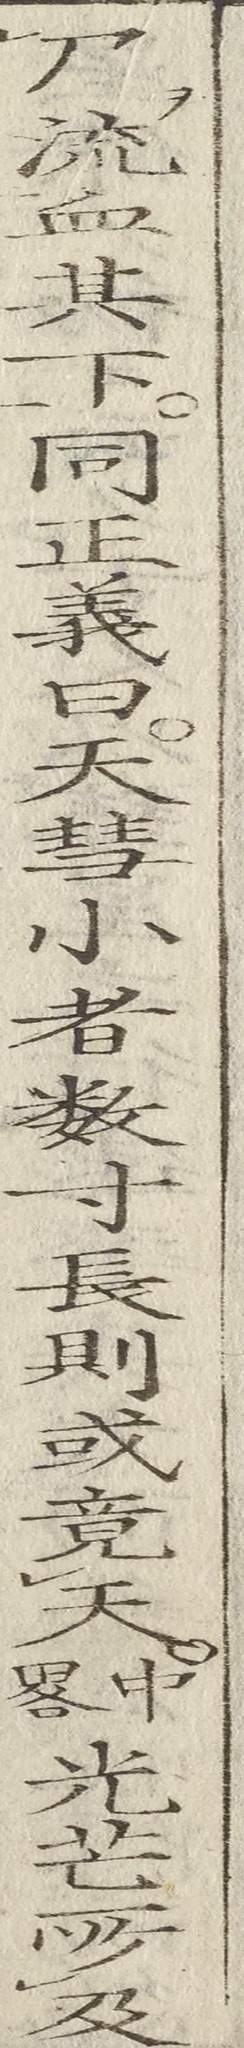尸流血其下。同正義曰。天彗小者数寸長則或竟天。中略光芒所及
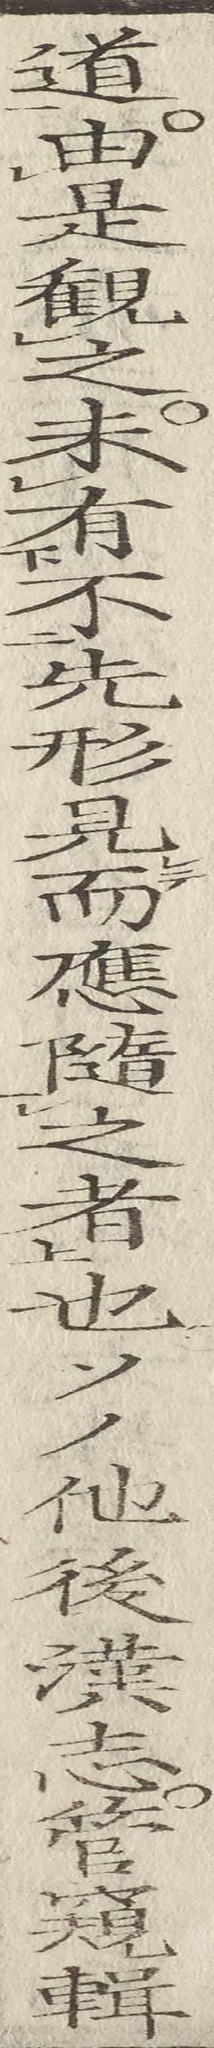道。由是観之。未有不先形見而応随レ之者也ソノ他後漢志。管窺輯
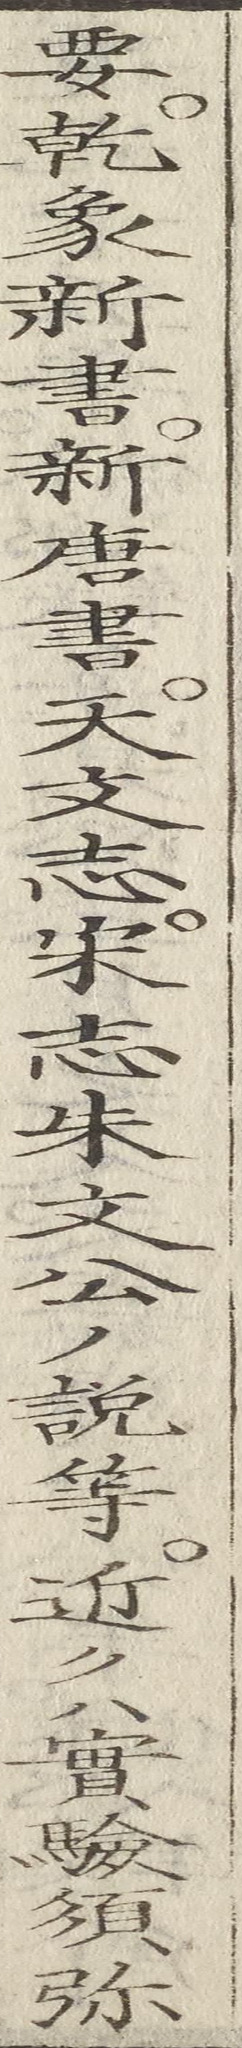要。乾象新書。新唐書。天文志。宋志朱文公ノ説等。近クハ実験須弥
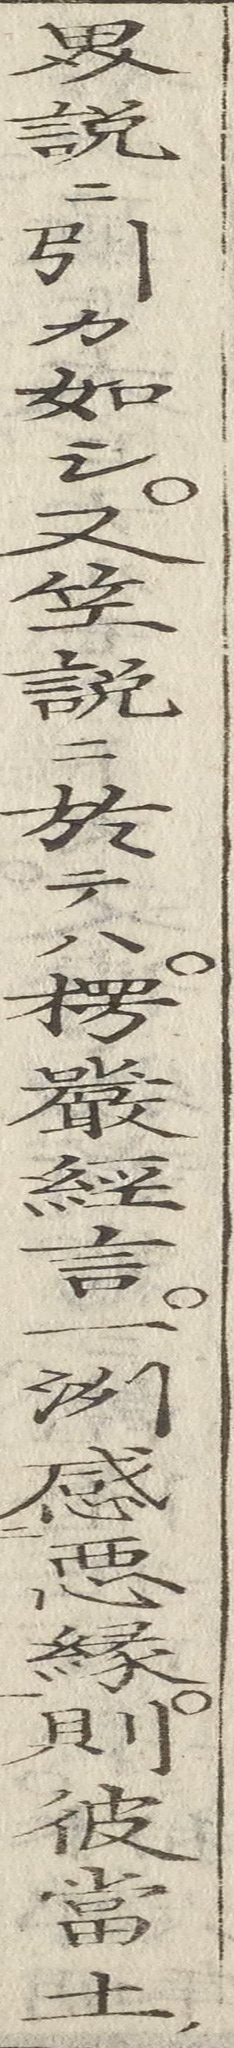界説ニ引カ如シ。又竺説ニ於テハ。楞巌経言。一洌感悪縁。則彼当土
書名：護法新論　中
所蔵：東京大学地震研究所図書室 Earthquake Research Institute Library, The University of Tokyo, JAPAN
